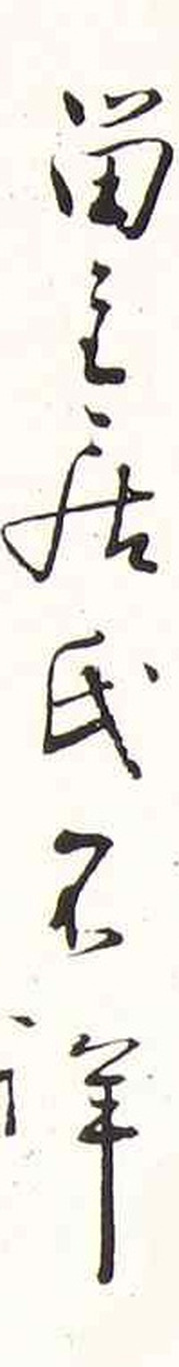留主居氏不詳
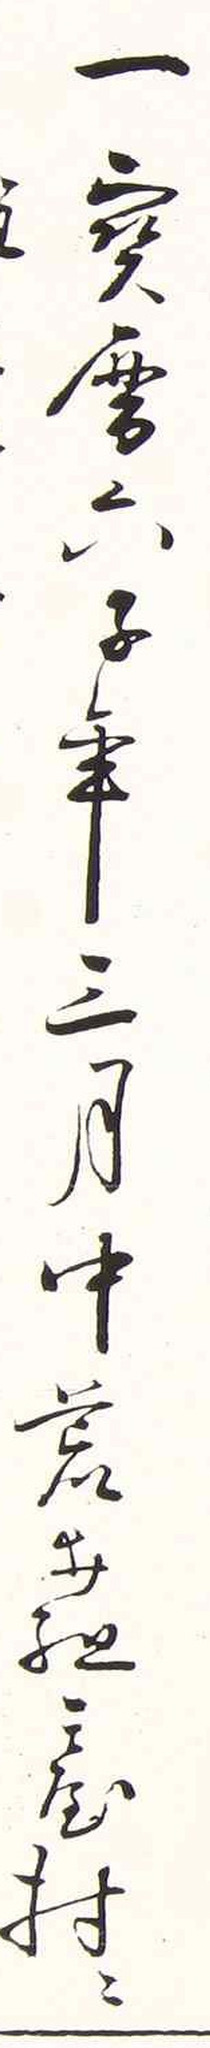一宝暦六子年三月中荒井組台村ニ
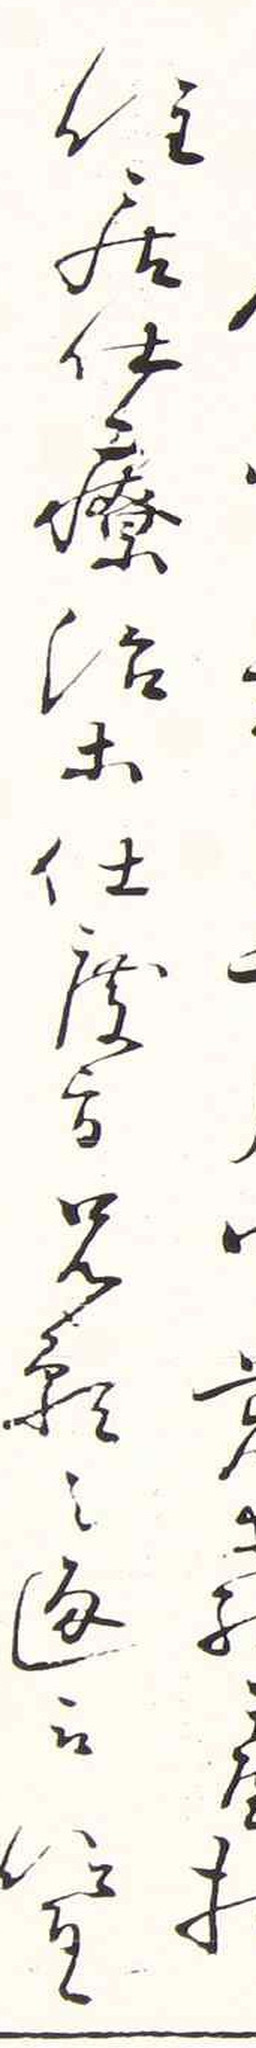住居仕療治等仕度旨兄願之通被仰付候

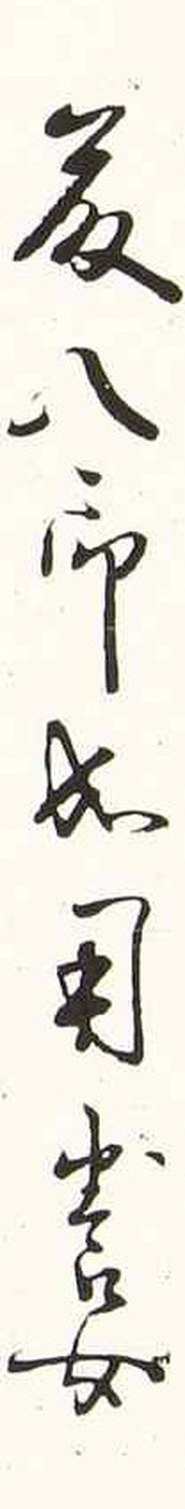女藤八郎成用養女
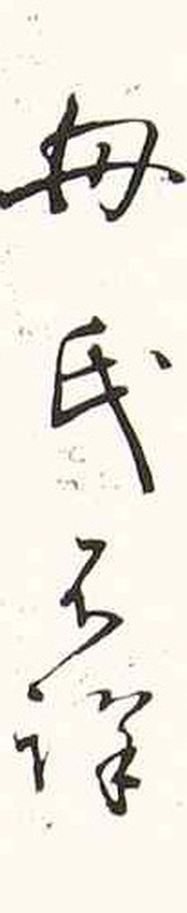母氏不詳
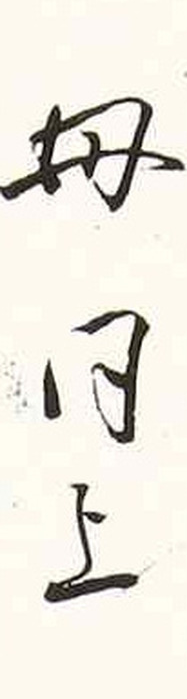母同上
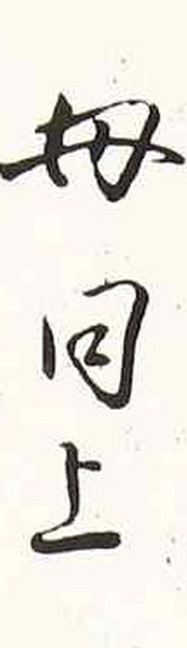母同上
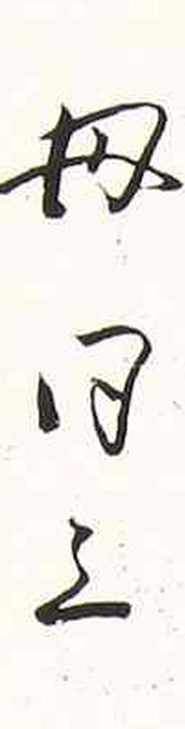母同三
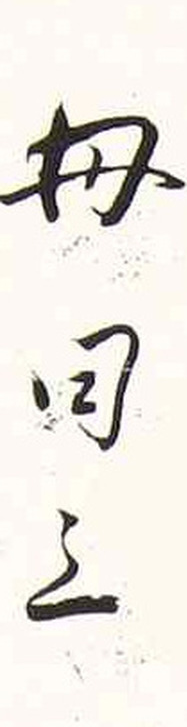母同三
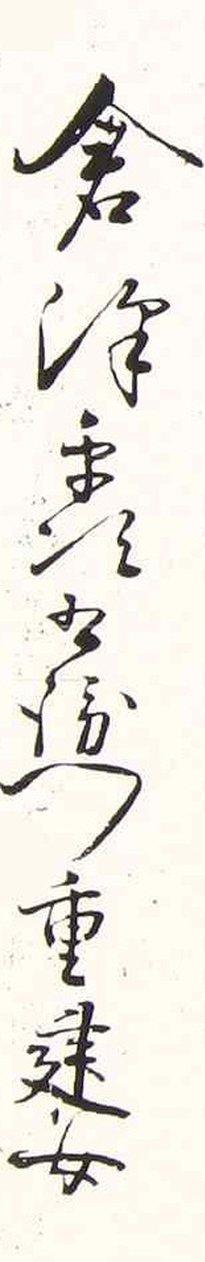女倉沢平次左衛門重建女
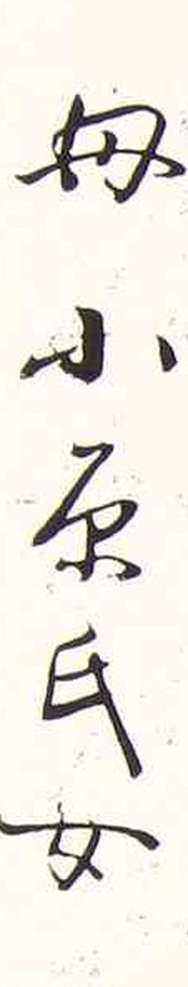母小原氏女

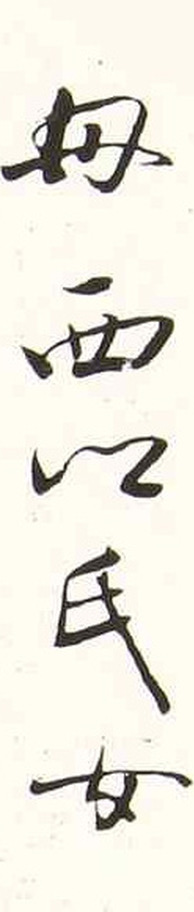母西郷氏女
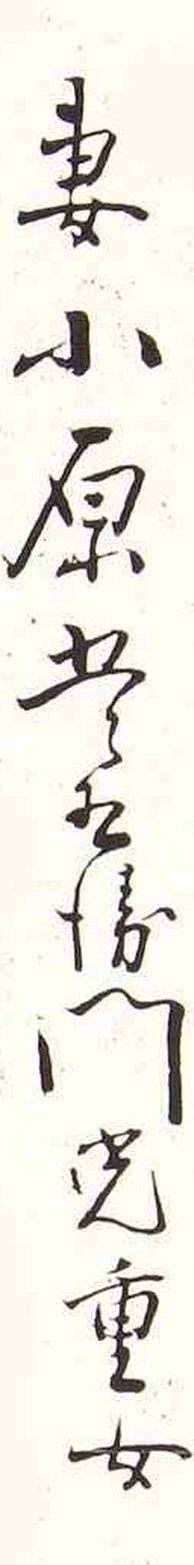妻小原五郎右衛門忠重女
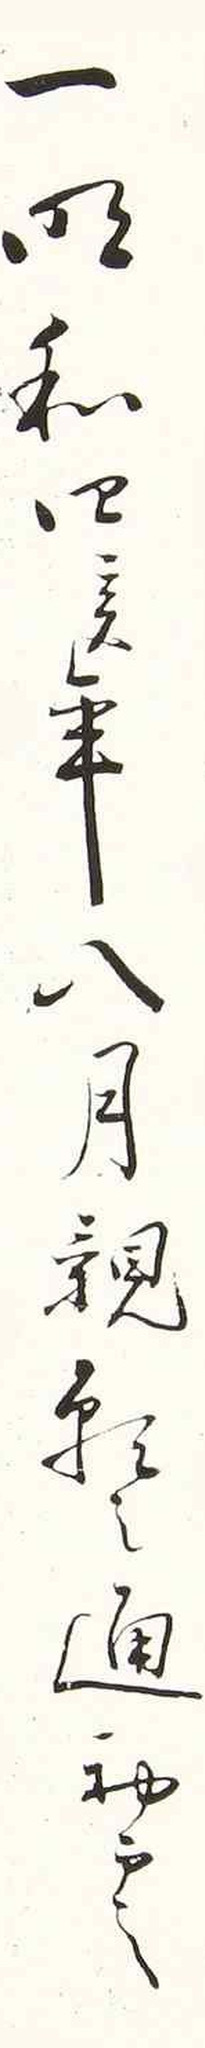一明和四亥年八月親願之通初而之
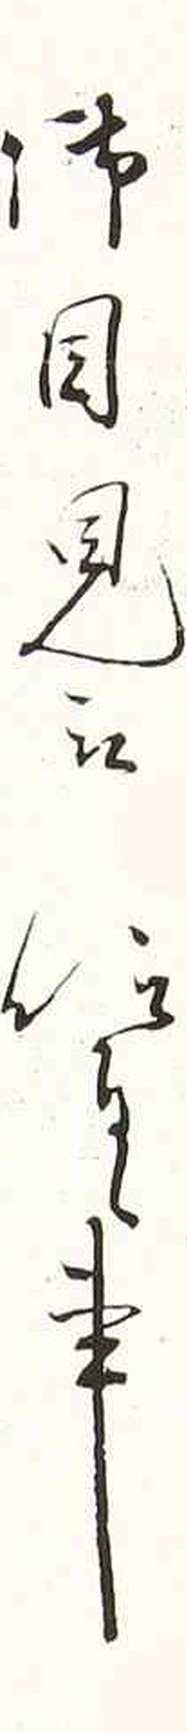御目見被仰付候事
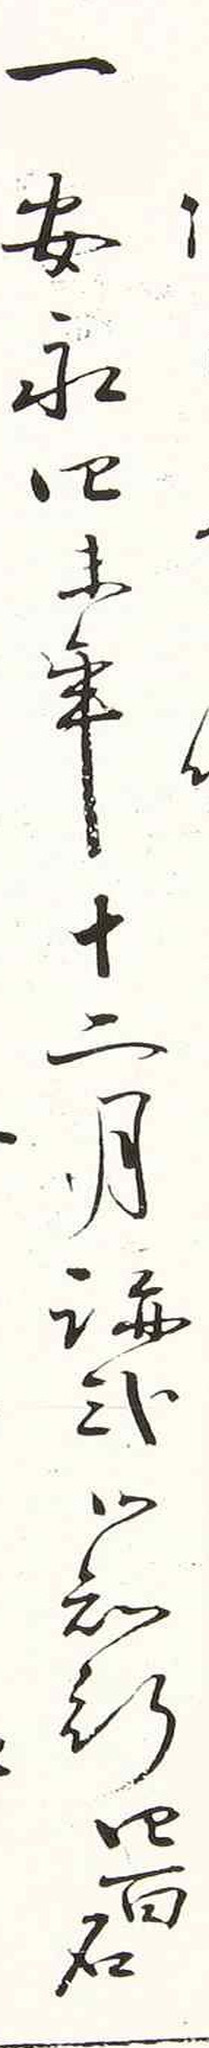一安永四未年十二月跡式御知行四百石
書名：諸士系譜　巻之357　す之部7
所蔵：会津若松市立会津図書館
